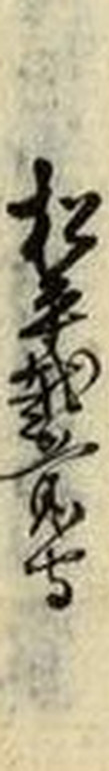松平越前守
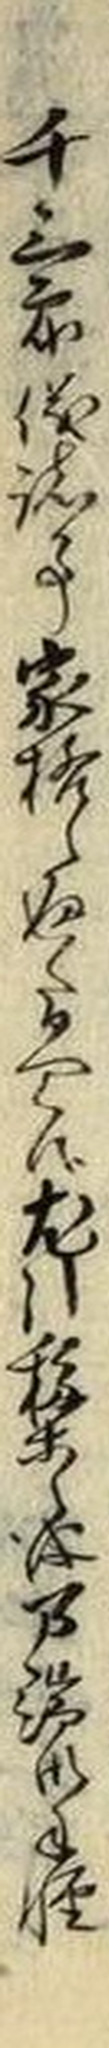千三郎儀諸事家格之通たる宣候尤引移等之儀万端御手軽
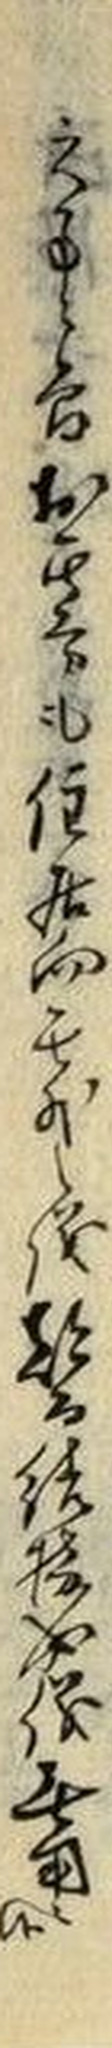之事ニ候間於其方も住居向其外之儀都而結構成儀無用ニ候

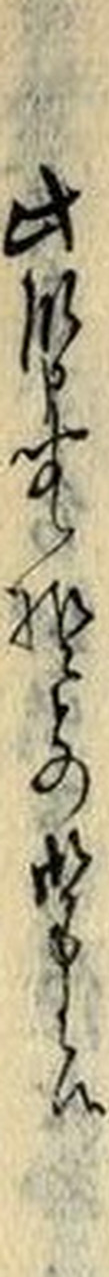此段申聞候様ニとの御事ニ候
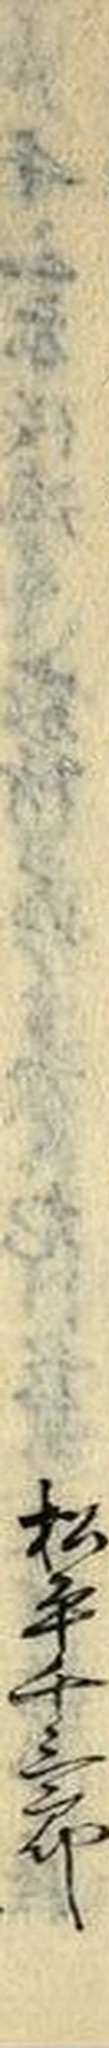松平千三郎
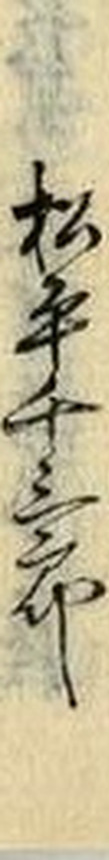松平千三郎
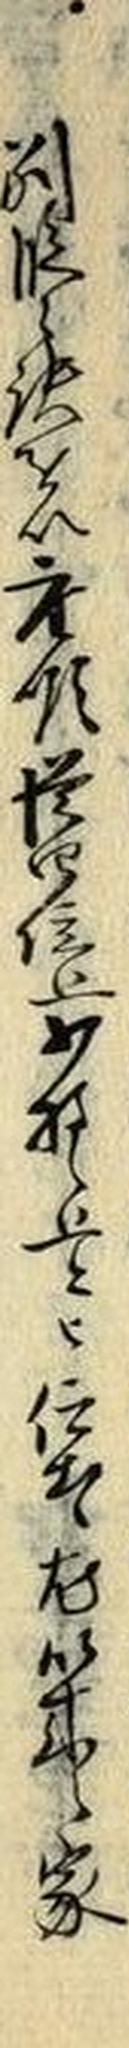別段之訳を以座順従四位上少将之上と被仰出候尤以来之家
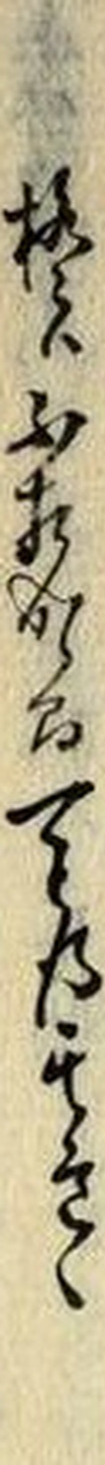格ニハ不相成候間可被得其意候
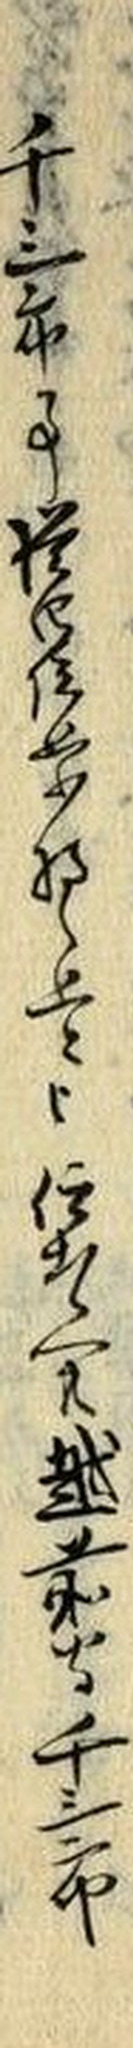千三郎事従四位上少将之上と被仰出候へ共越前守千三郎
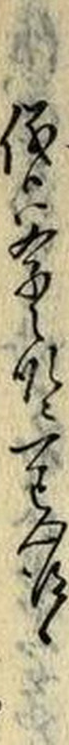儀ハ父子之順ニ可被心得候
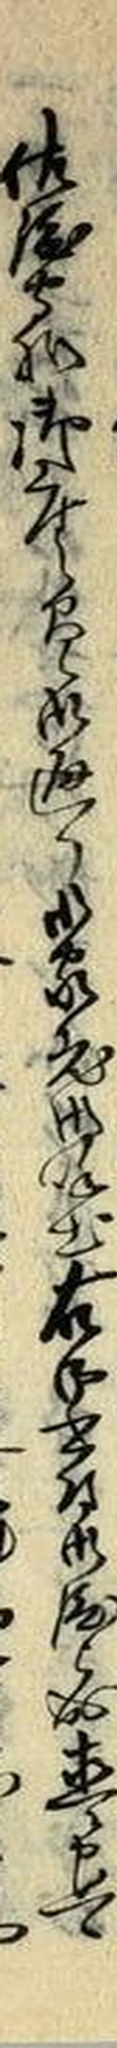佐渡守様御座之間へ御通り御家老御呼出右御書付御渡被成直ニ申上候
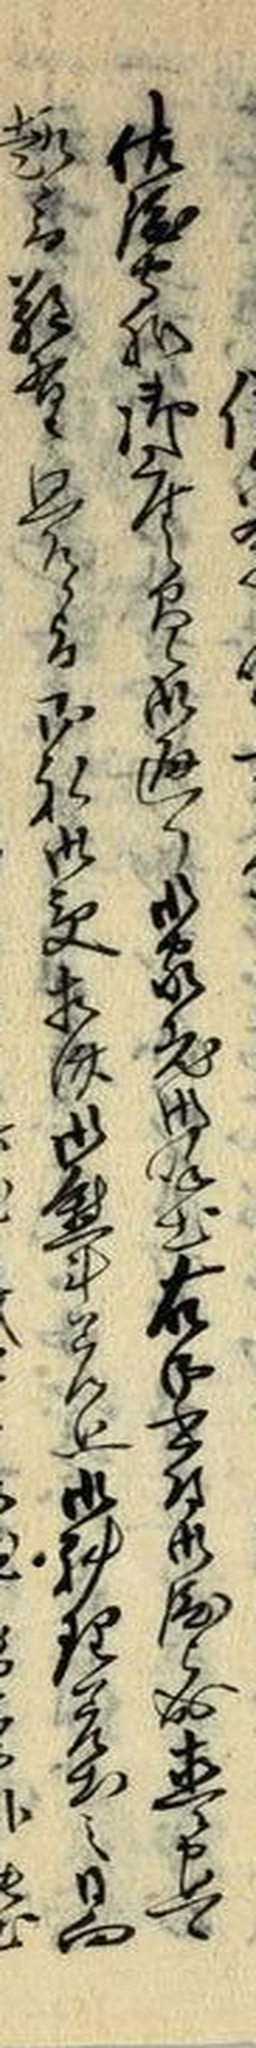趣ニ而難有被思召候旨御礼御受相済御熨斗差上御料理差出之日向
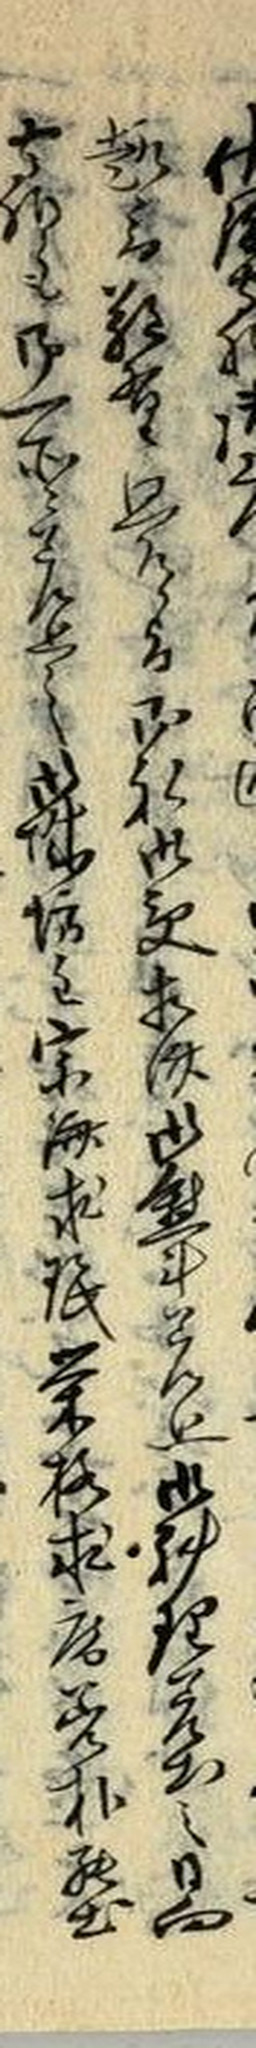守様ニも御一所ニ差上之御城坊主宗済求珉栄格求庵善朴罷出
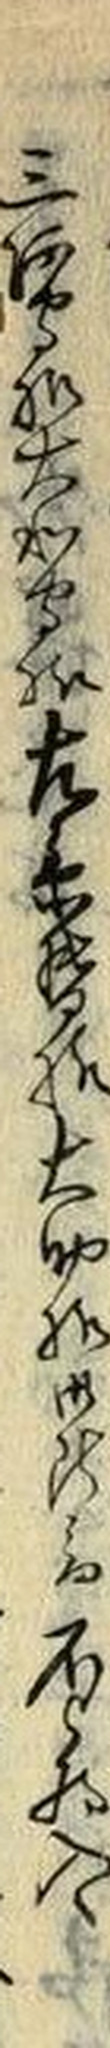三河守様大和守様左兵衛督様大助様御断ニ而不被為入候
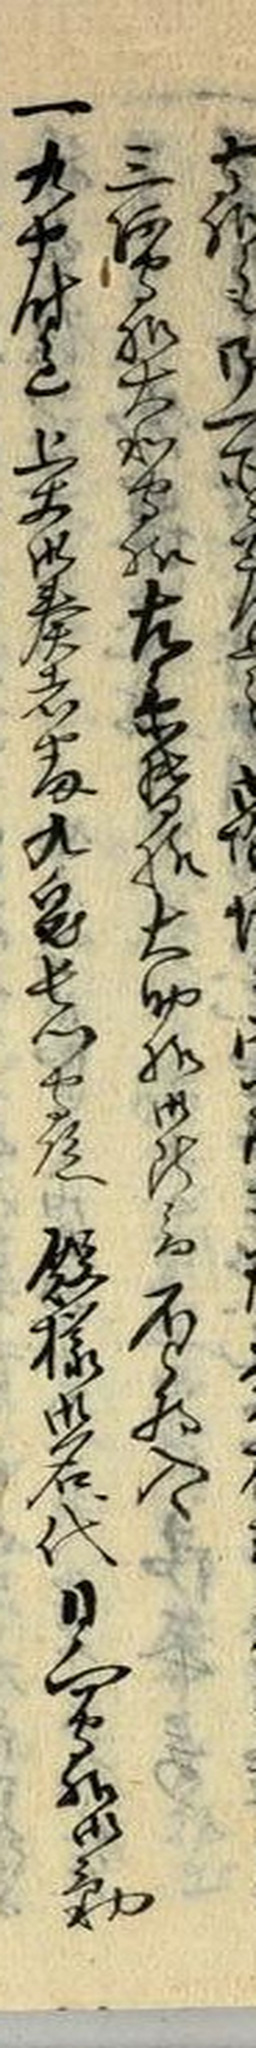一九半時過上使御奏者番九鬼長門守殿殿様御名代日向守様御勤
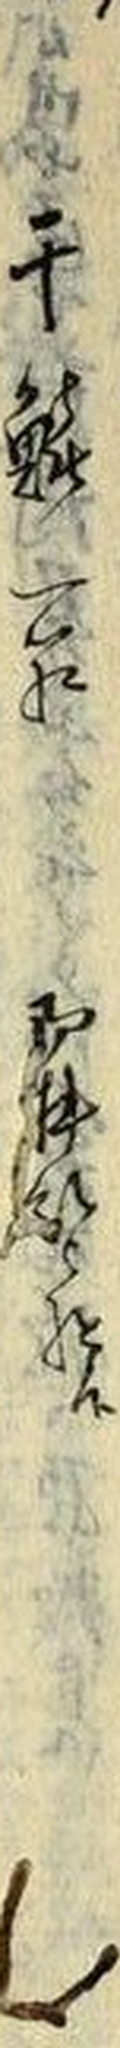干鱚一箱御拝領被遊候
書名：少傅日録抄（斉承付側向頭取日記、在府）
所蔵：福井県文書館 Fukui Prefectural Archives
